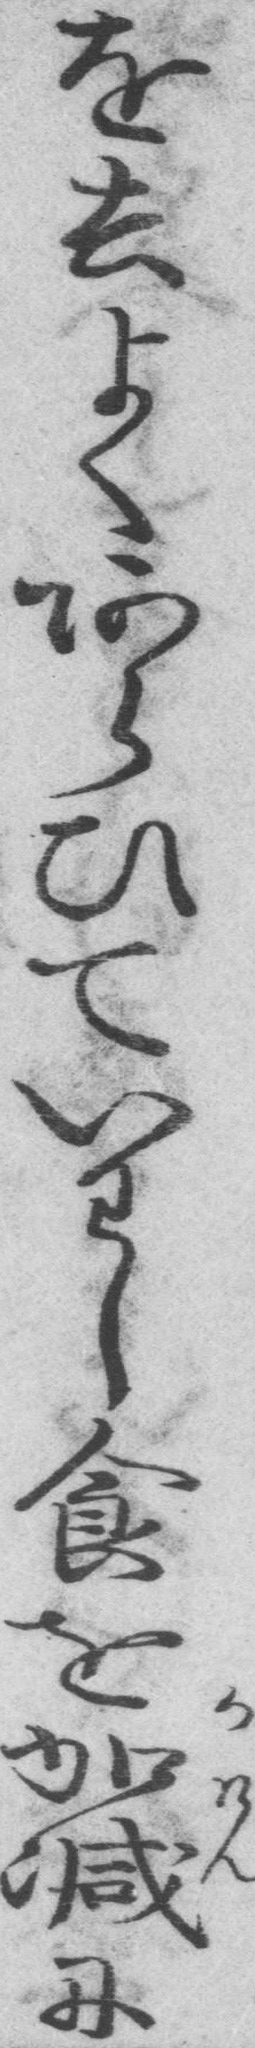を去よく阿らひていわし食を加減丹
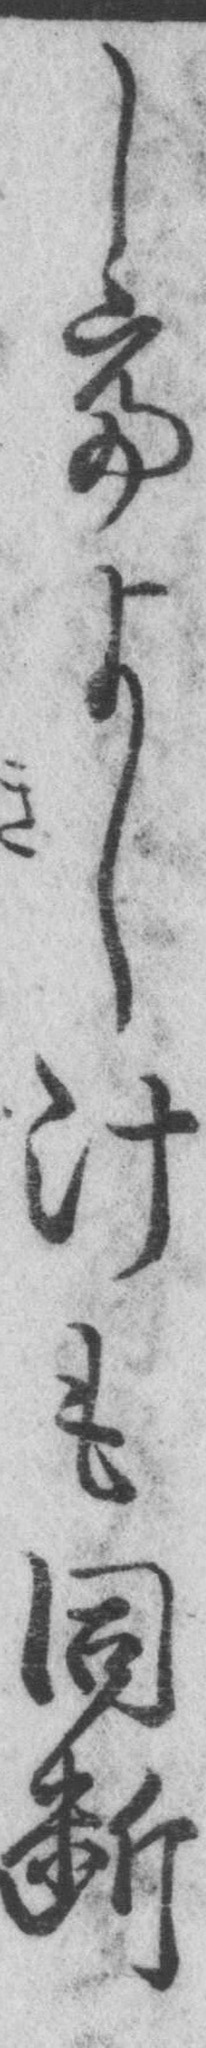し亭よし汁も同断
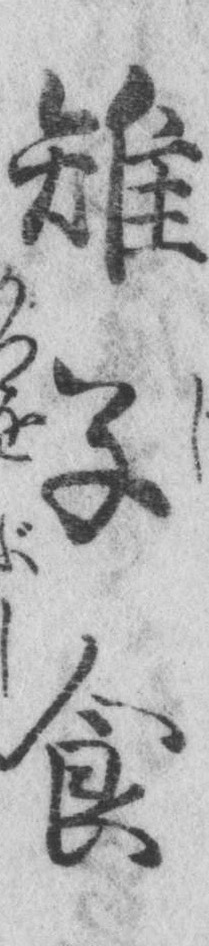雉子食
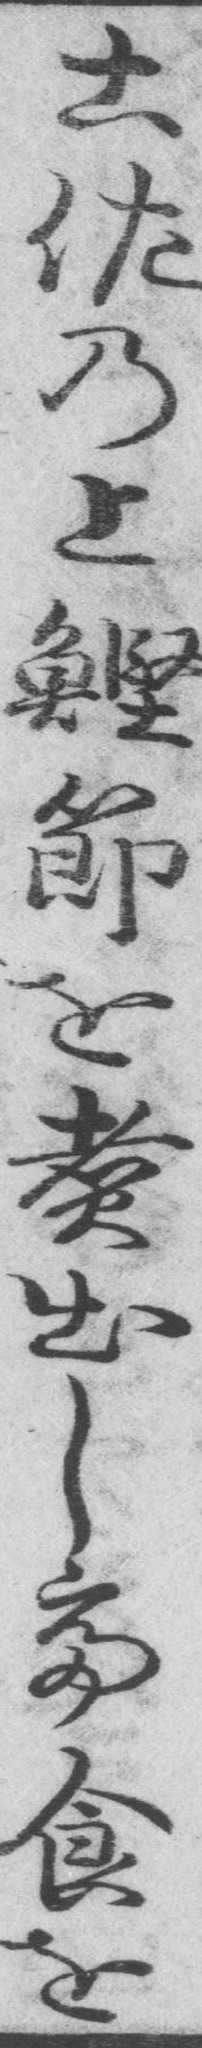土佐乃上鰹節を煮出し亭食を
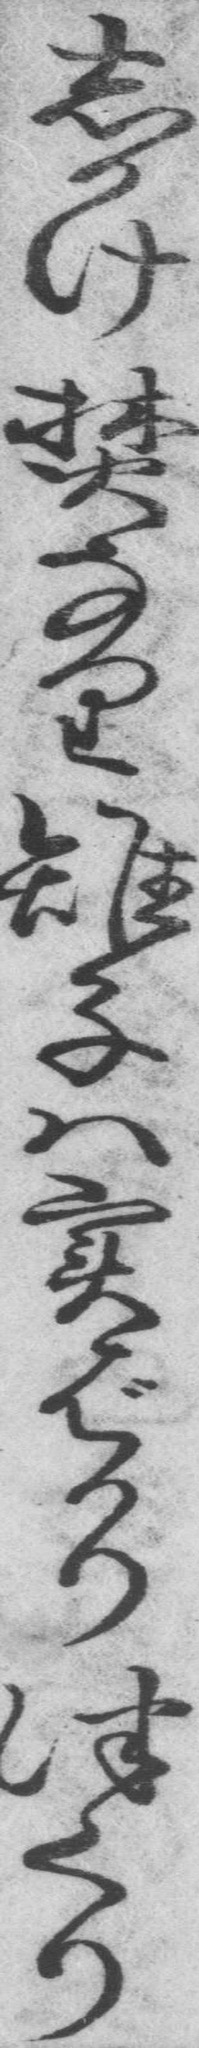志かけ焚な里雉子は実ばかり津くり
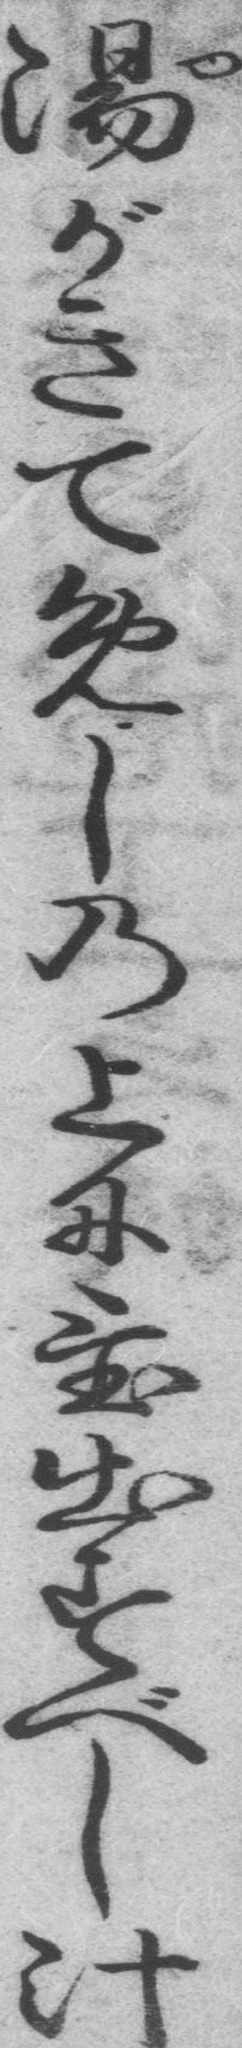湯がきて免し乃上丹置出春べし汁
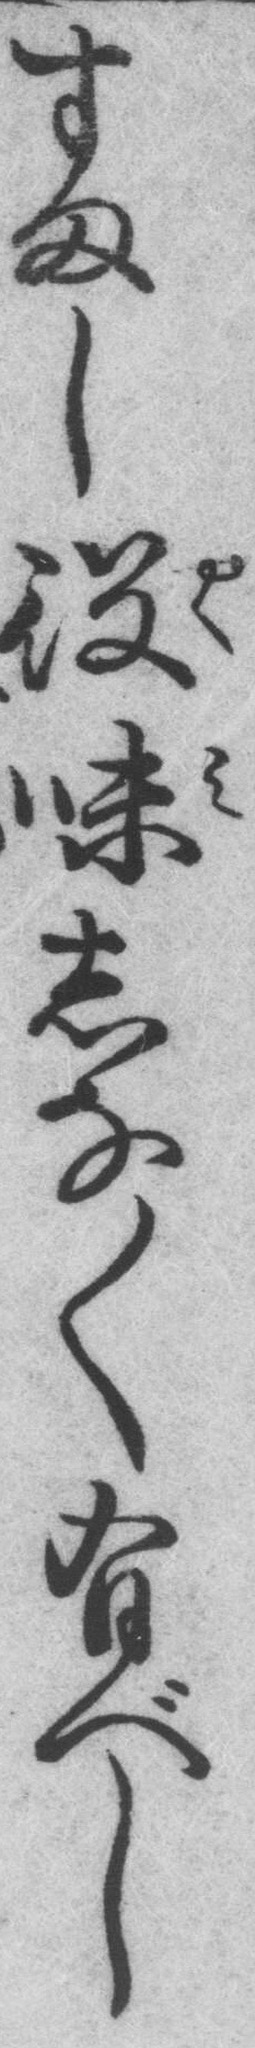すまし役味志な〳〵有べし
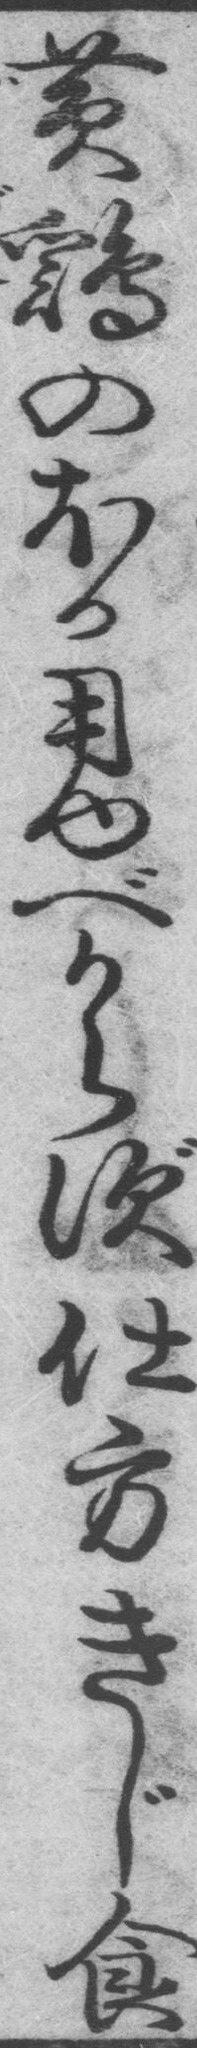黄鶏の不る用ゆべからず仕方きじ食
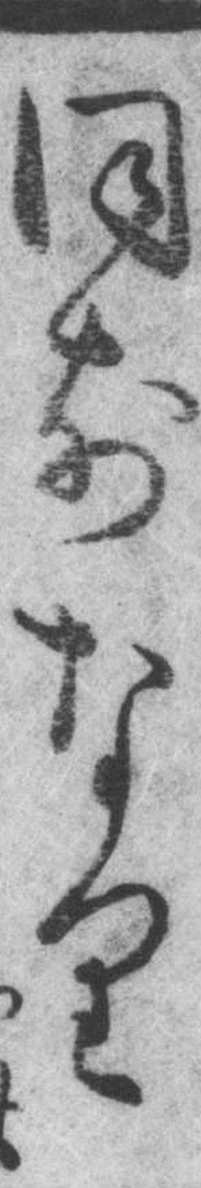同前な里
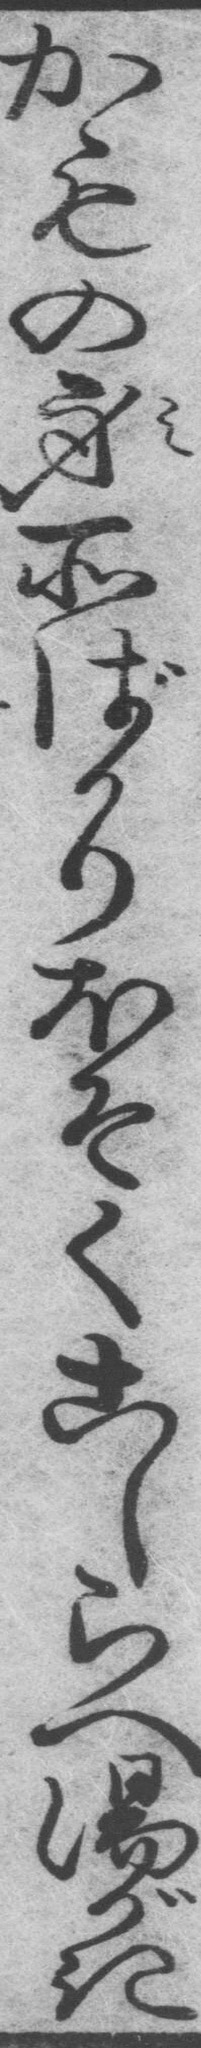かもの身所ばかり不そく古しらへ湯が起
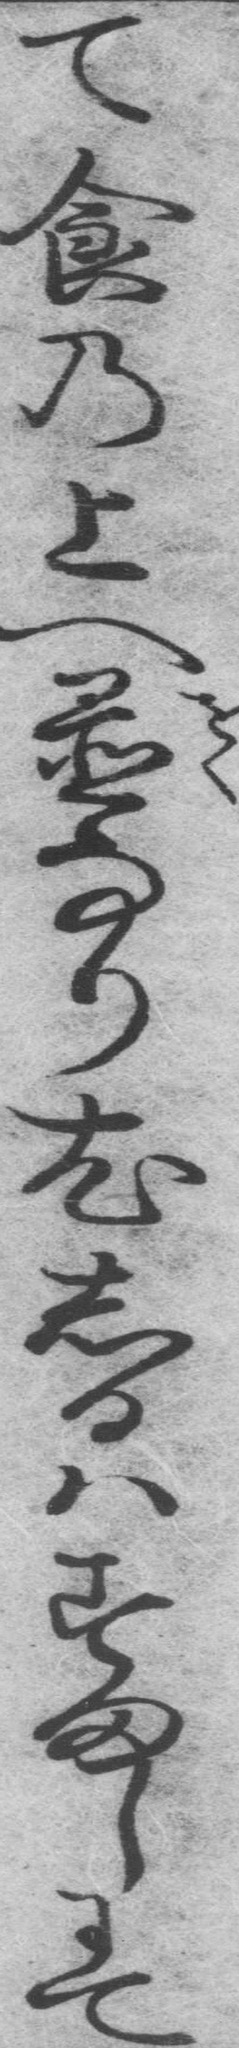て食乃上へ置なり尤志るは春まし尓て
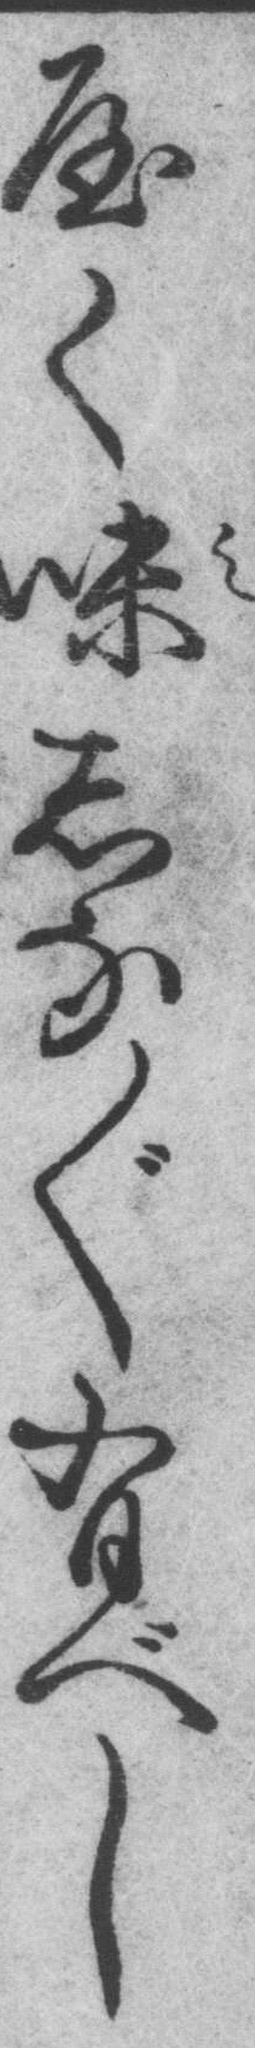屋く味志な〴〵有べし

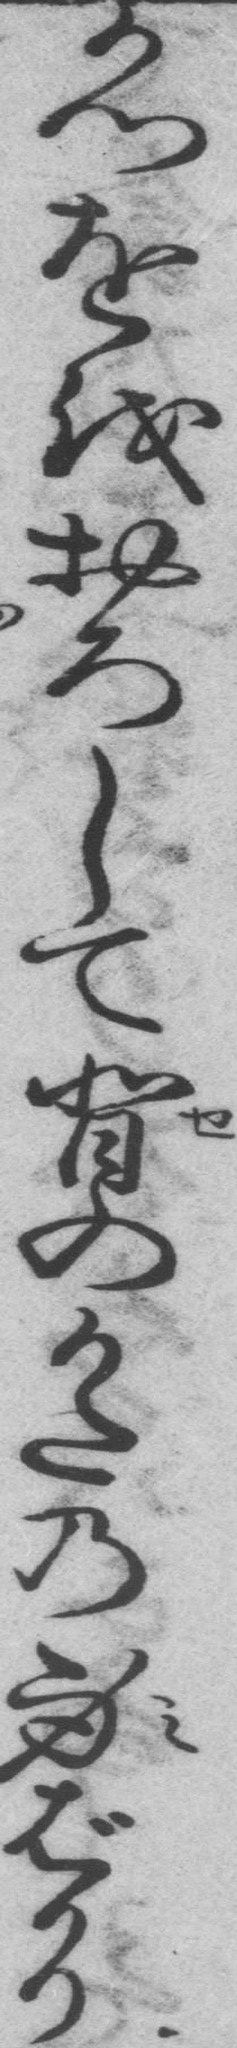かつを越おろして背のかた乃身ばかり
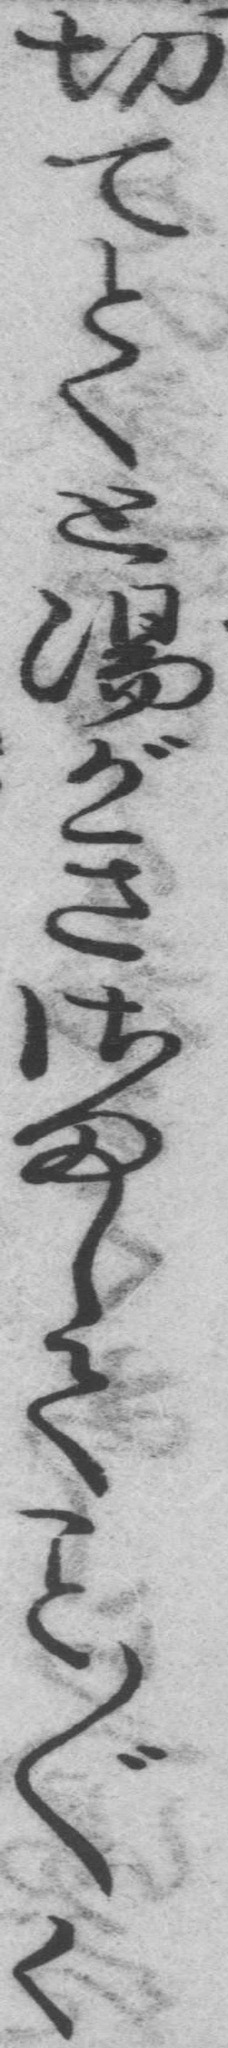切てとくと湯がき佐ましてこと〴〵く
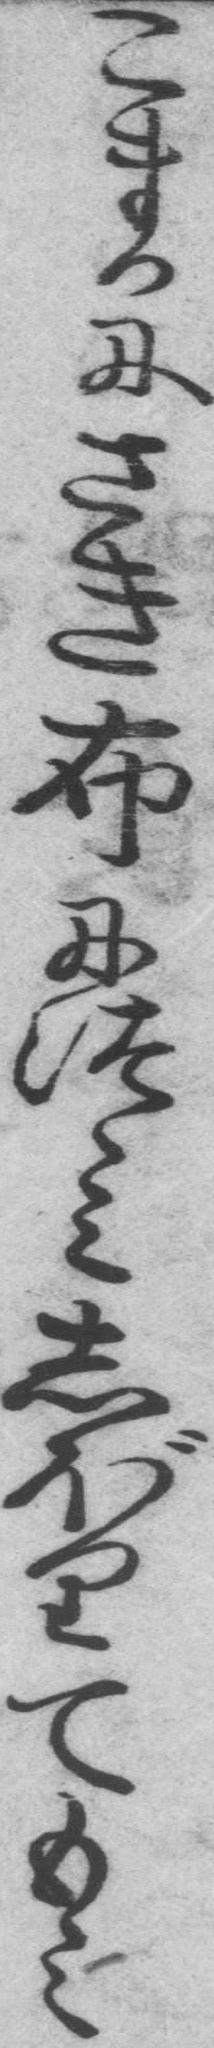こまか丹さき布丹徒々み志ぼ里てもみ
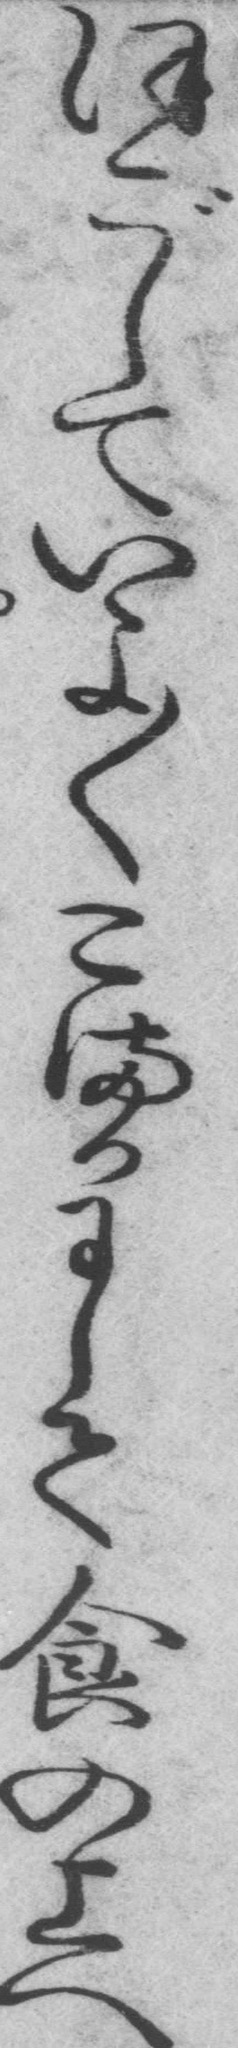ほごしていよ〳〵こ満か尓して食の上へ
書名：料理伊呂波庖丁
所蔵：大阪府立大学学術情報センター 国文学研究資料館
